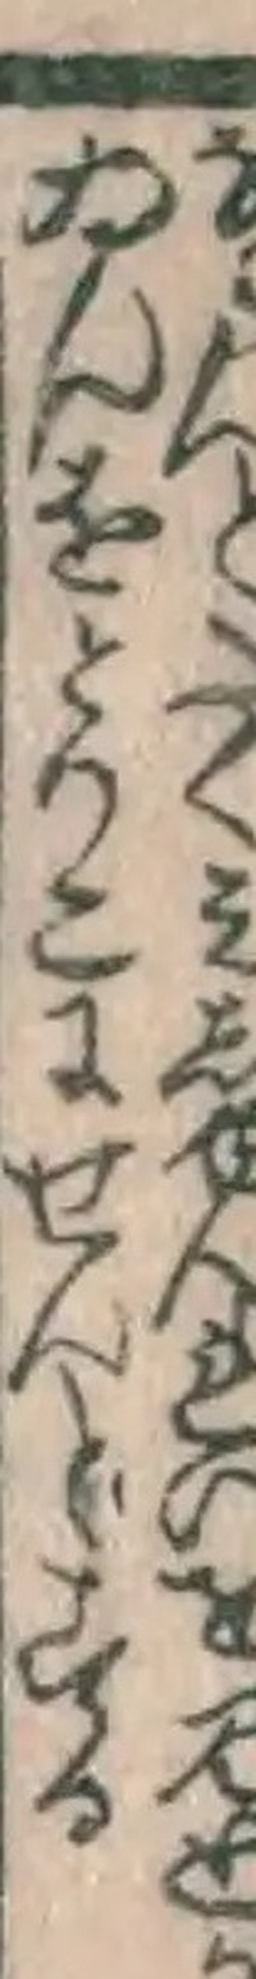ゐんをとりこにせんとする
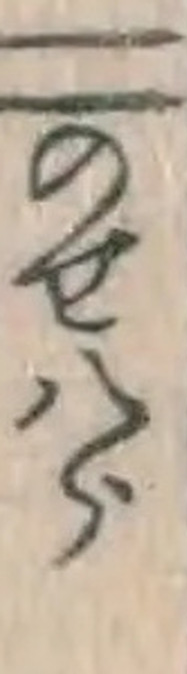のせ八郎
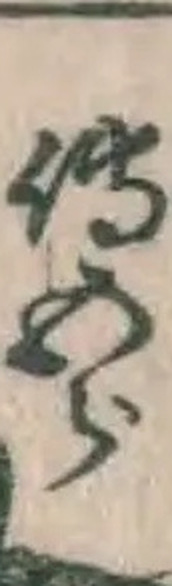伝五郎
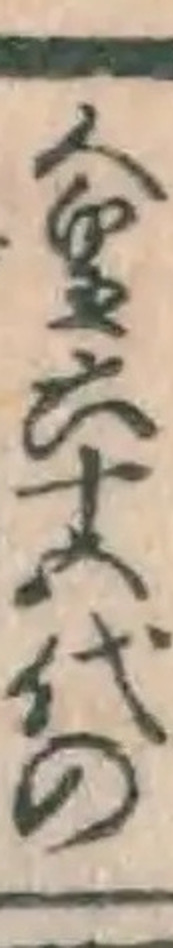人皇六十五代の
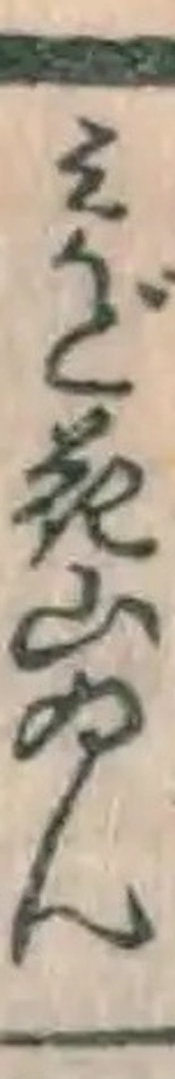みかど花山ゐん
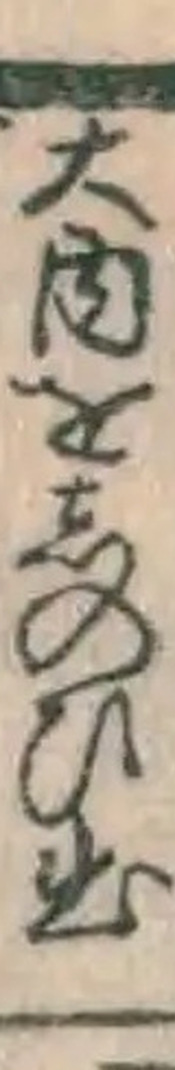大内をしのひ出
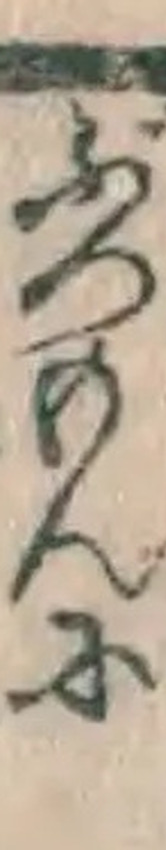ぶつもんに
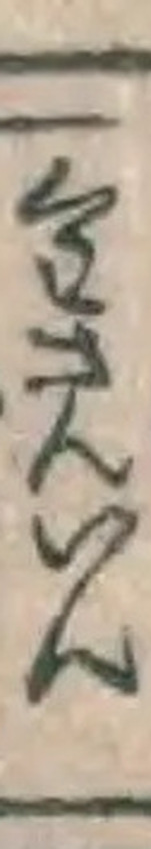くわさんいん
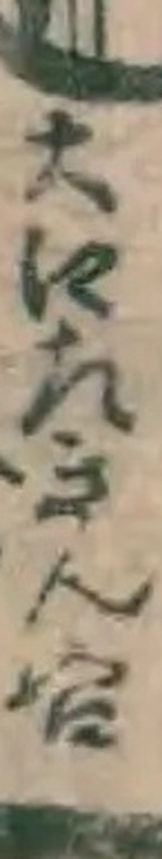大江左きん吾
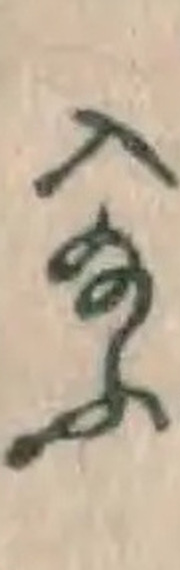入給ふ
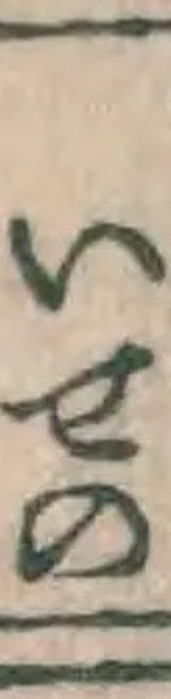いせの
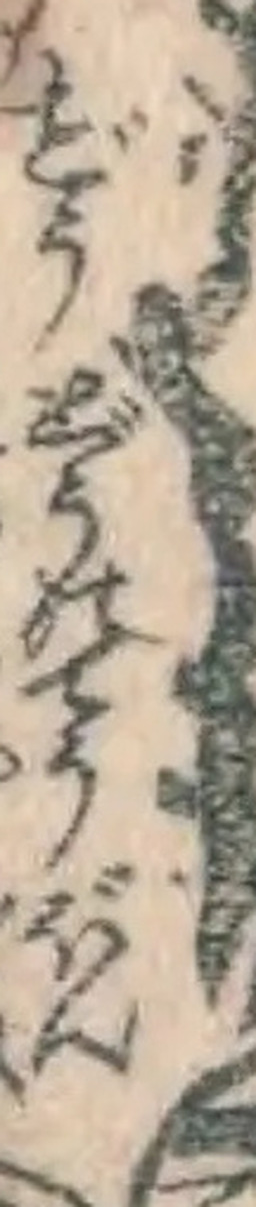ごうどうのてうぼん
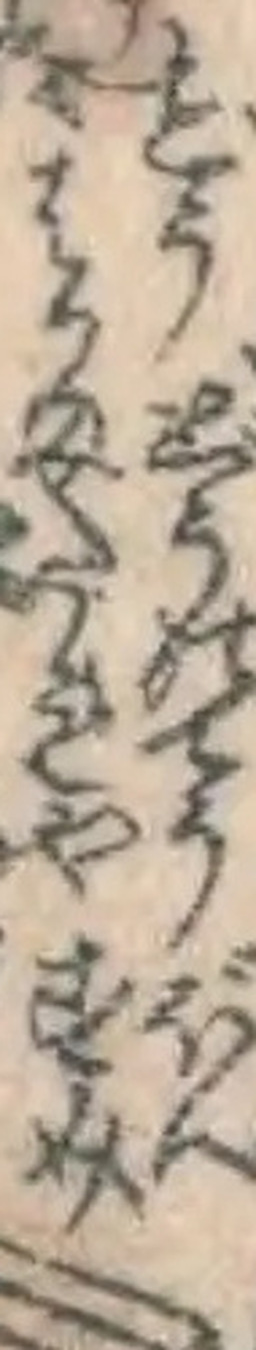はかまたれやす介
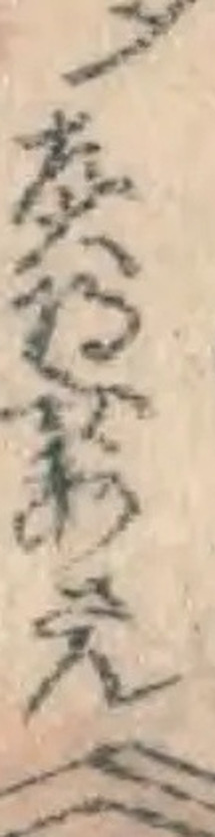左大将女さん
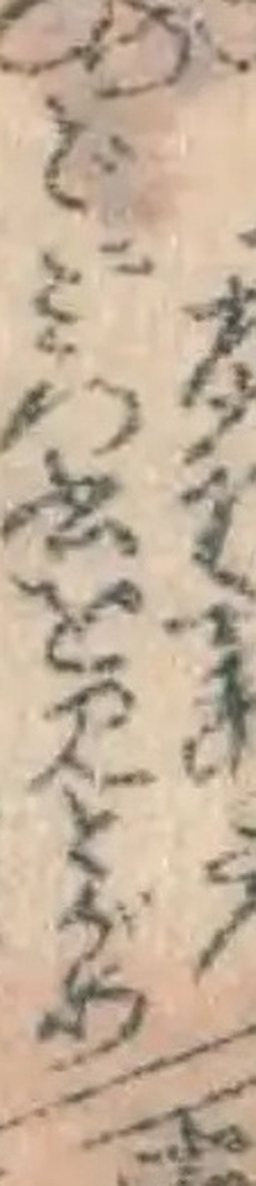どみつ書を見とがめ
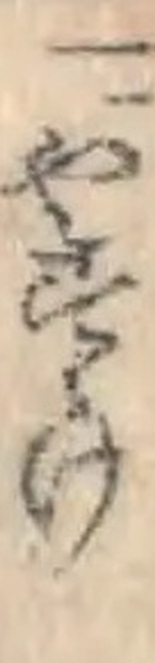やすゝけ
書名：四天王宿直着綿
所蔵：国立国会図書館 National Diet Library, JAPAN
